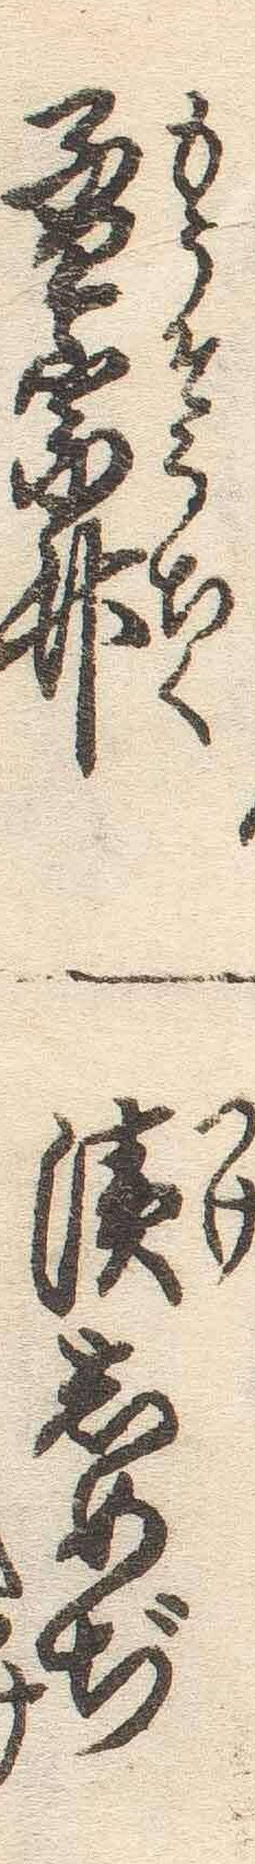孟宗竹漬しめぢ

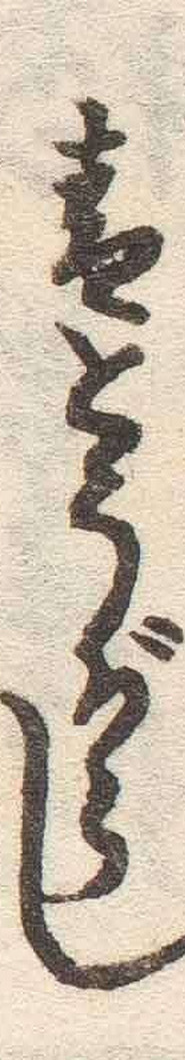柚青とうがらし
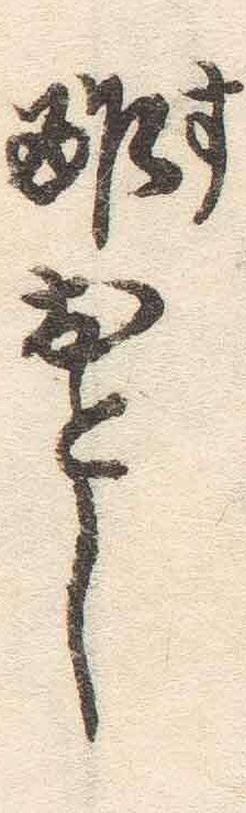酢おとし
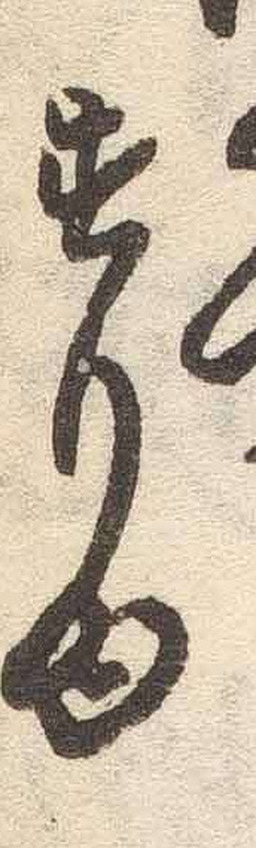すりゆ
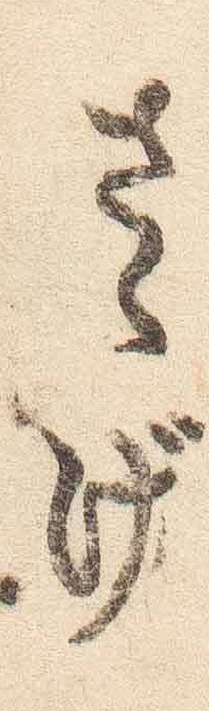さゝげ
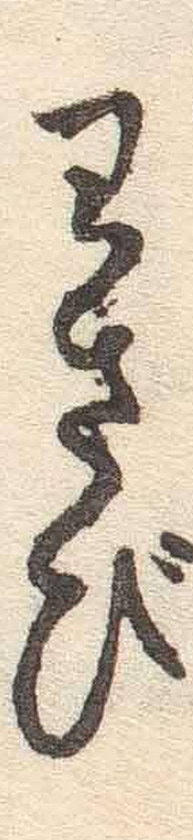わさび
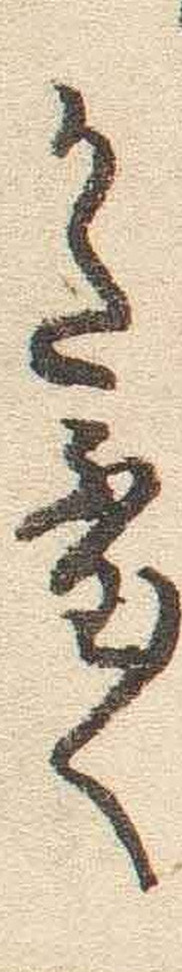かたふわ〳〵
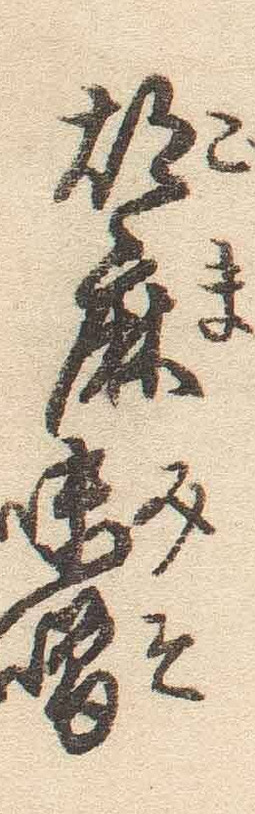胡麻味噌
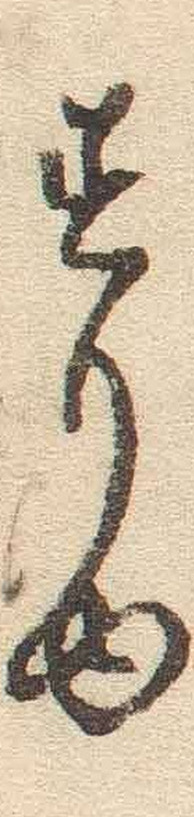すりゆ

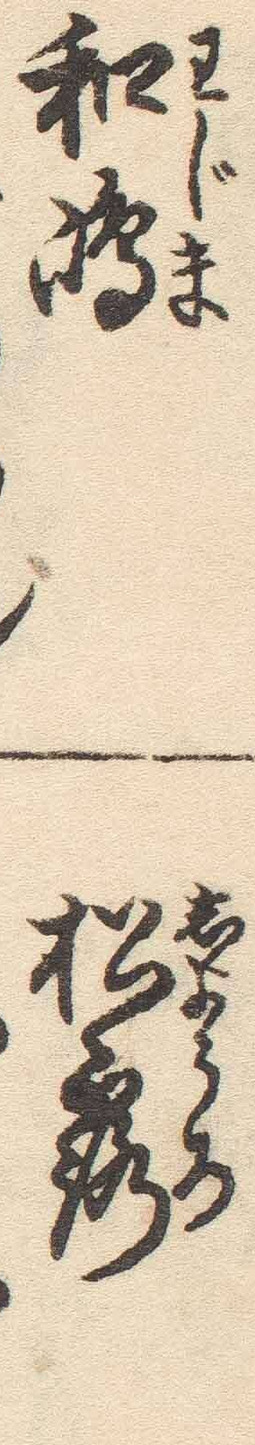和島松露
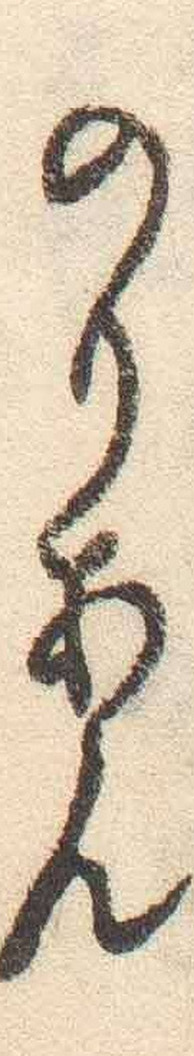のりあん
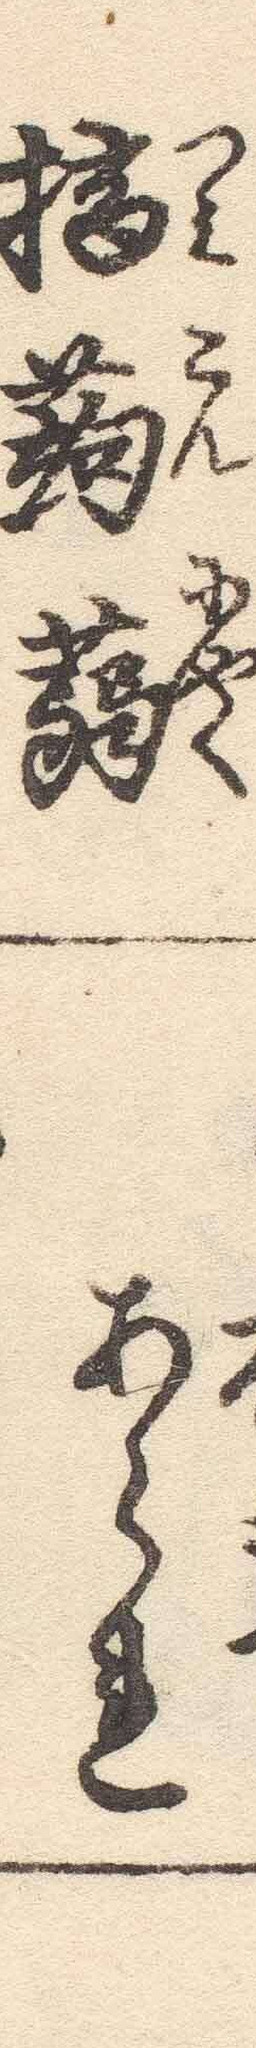摘蒟蒻あられ
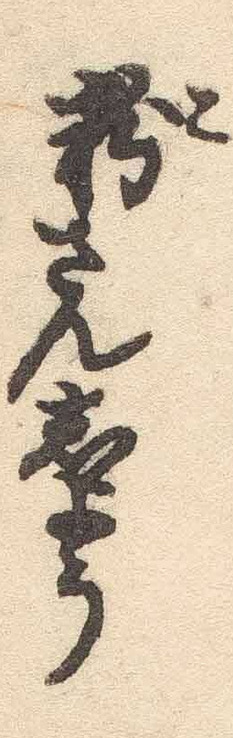粉さんしやう菜
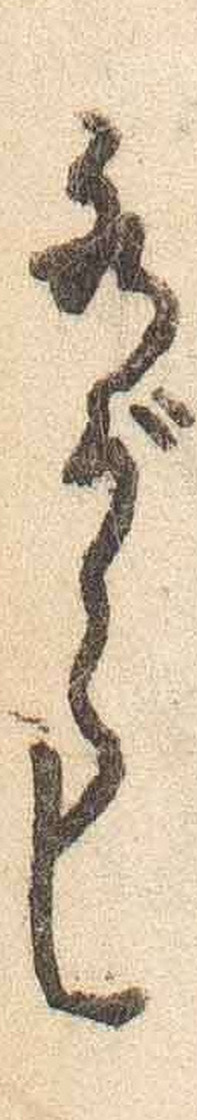水がらし
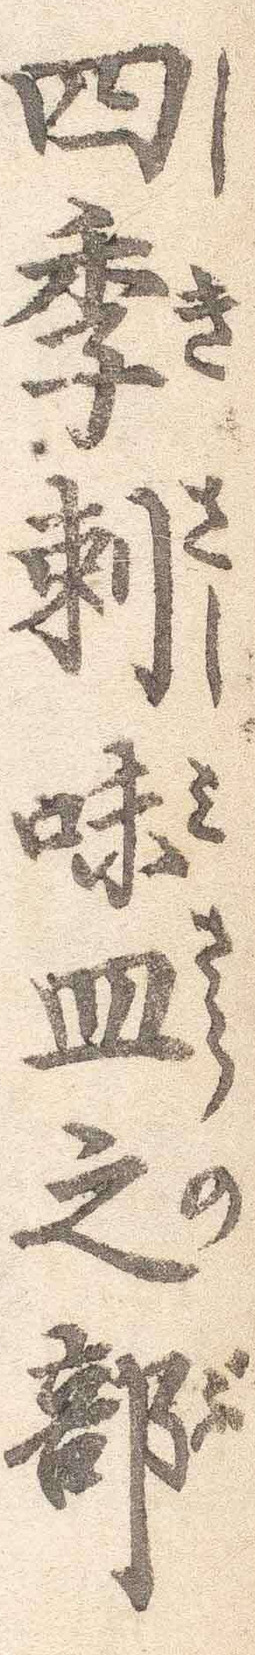四季刺味皿之部
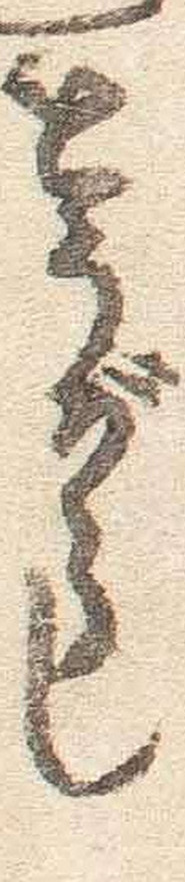とうがらし
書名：料理通
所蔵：東京学芸大学附属図書館 国文学研究資料館
